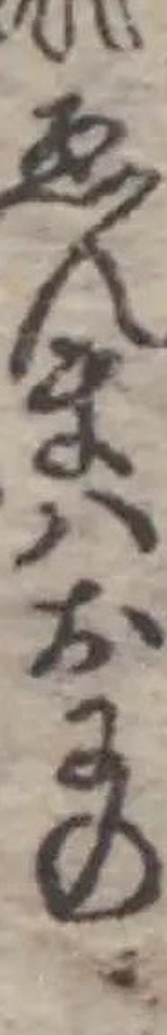ゑんまはおにの
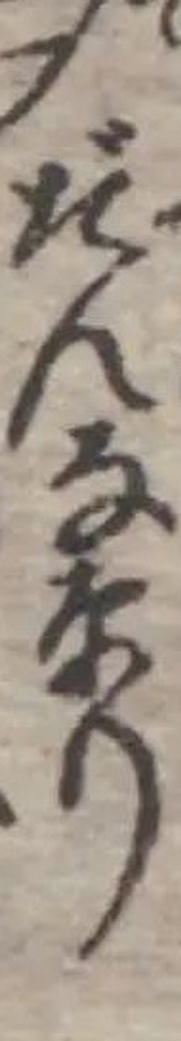だんななり
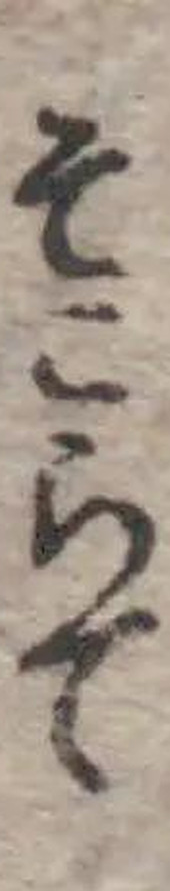そこらて
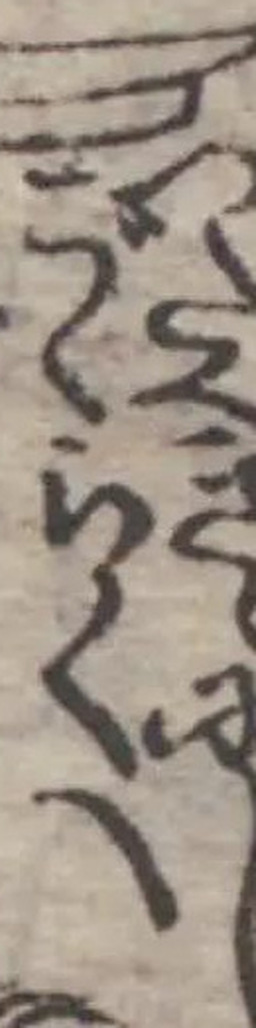ごくらくへ
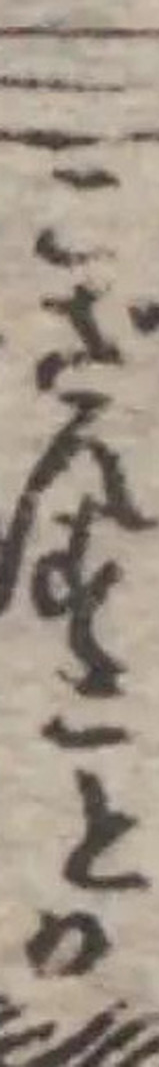ござんすことか
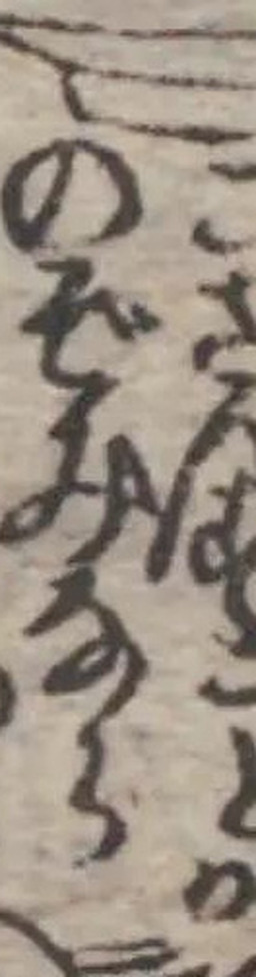のぞみなら
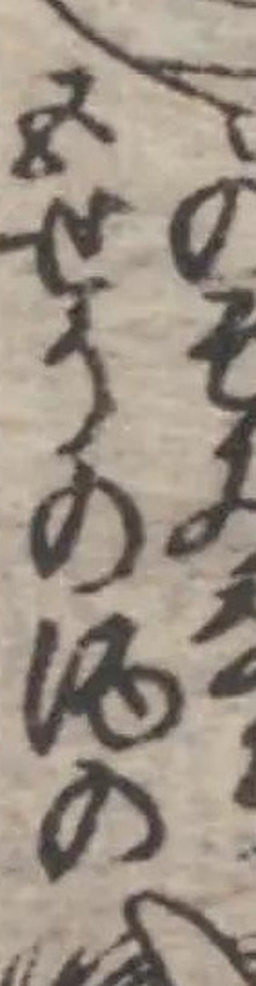五せうの酒の
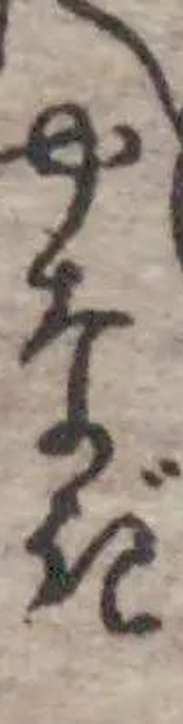やなぎ
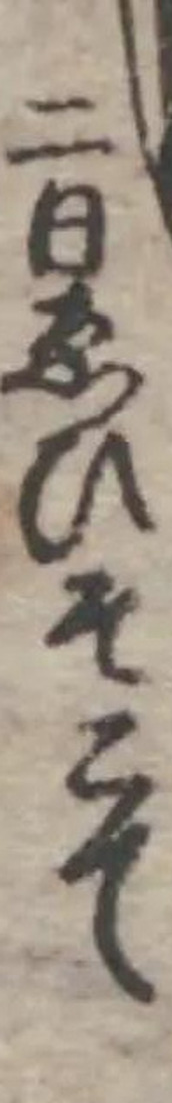二日ゑひそこて
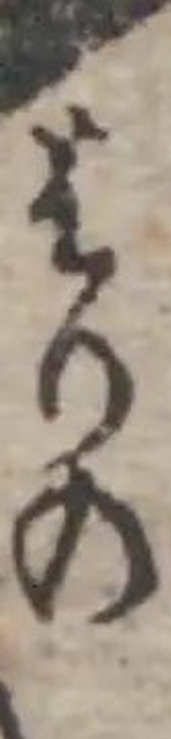はりの
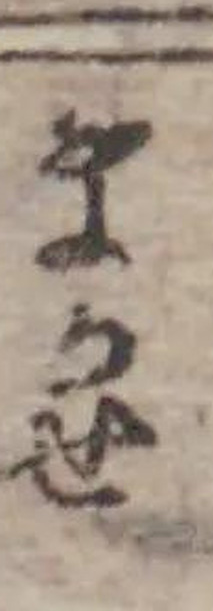まかせ
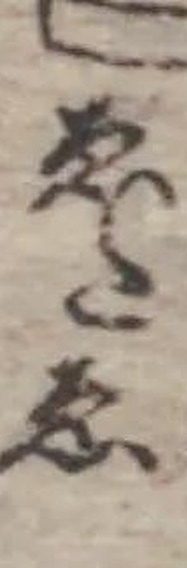ゑたゑ
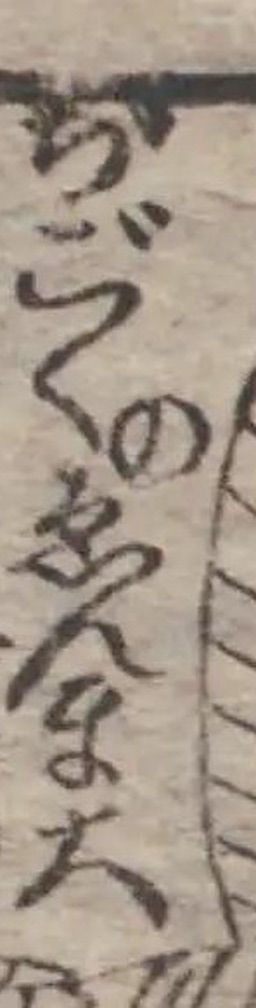ぢごくのゑんま大
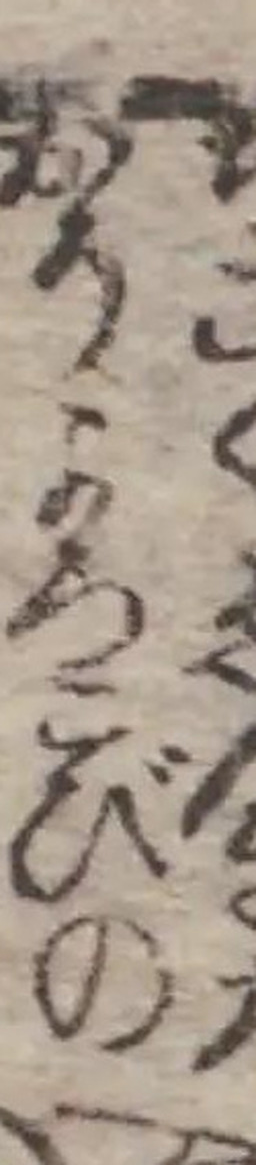おうよろこびの
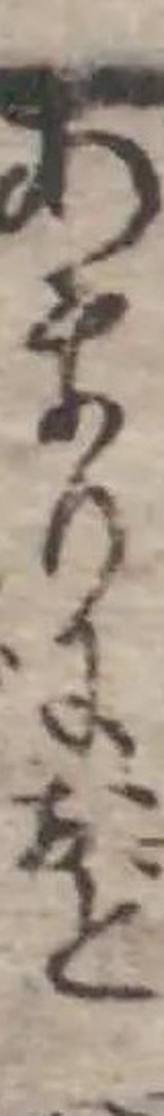あまりにおど
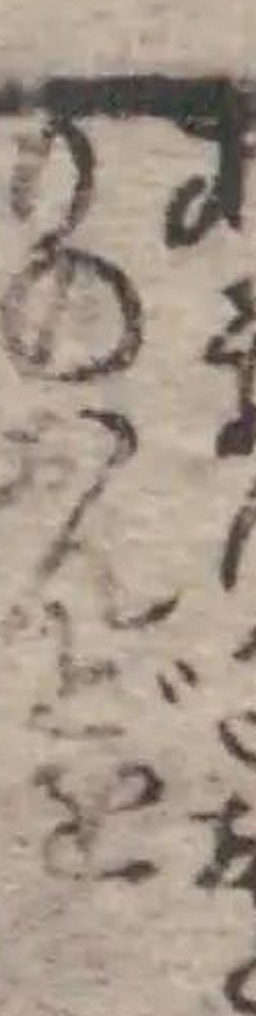りのおんどを
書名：大磯地蔵咄 2巻
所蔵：国立国会図書館 National Diet Library, JAPAN
